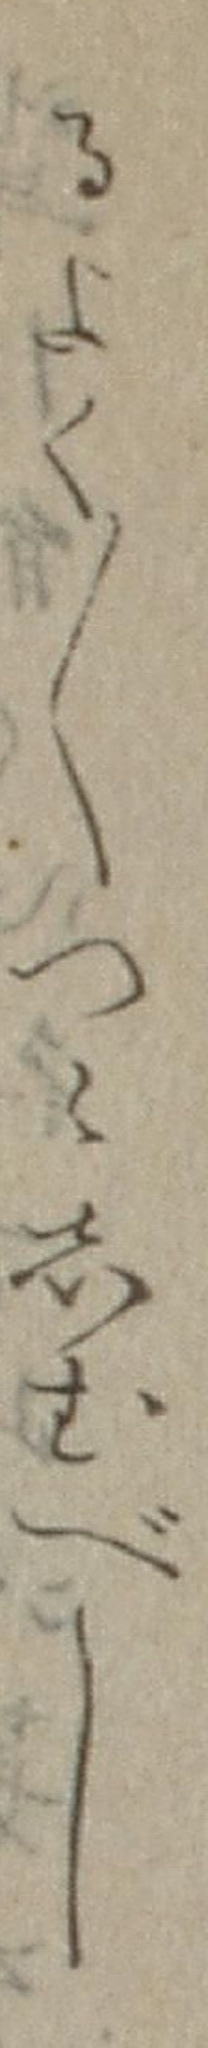るよく〳〵つゝしむべし
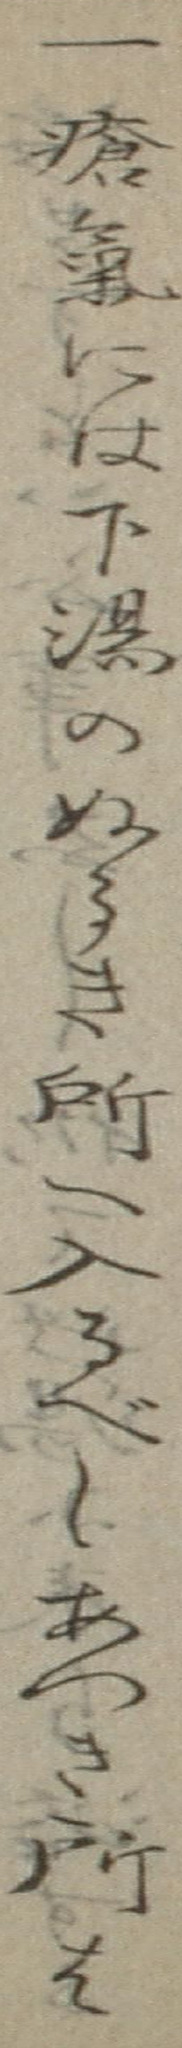一瘡気には下湯のぬるき所へ入るべしあつき所は
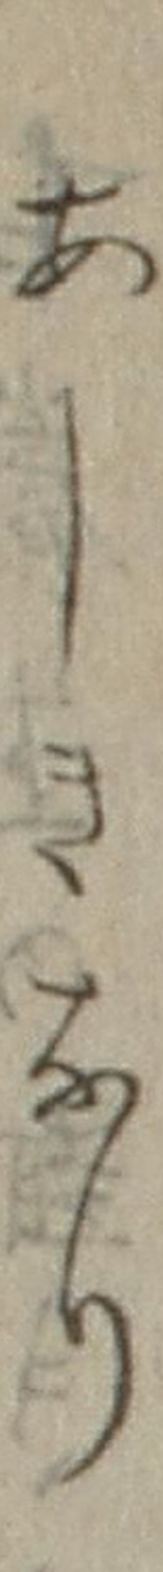あしきなり
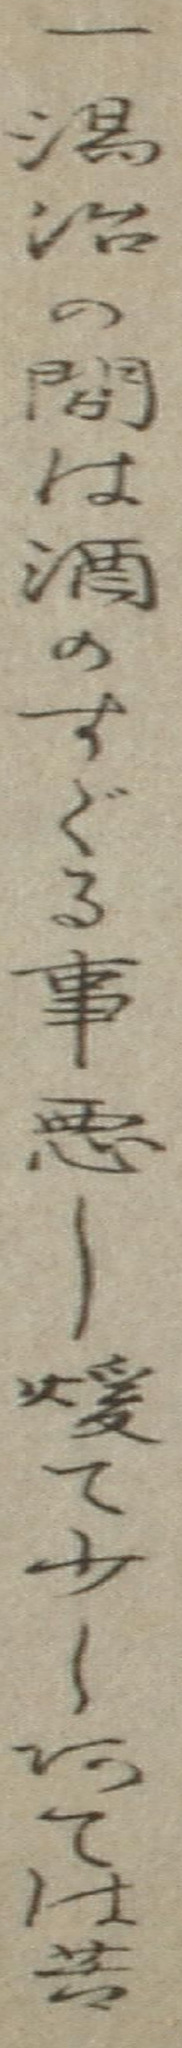一湯治の間は酒にすぐる事悪し煖て少しにては苦
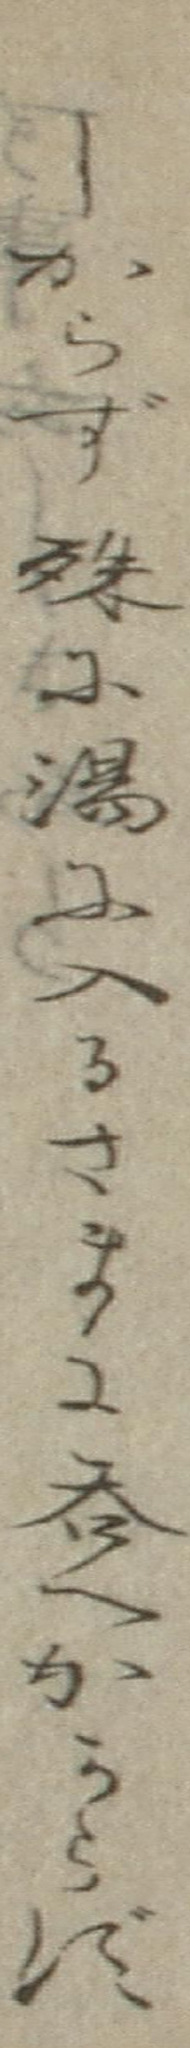しからず殊に湯に入るさまに呑へからず
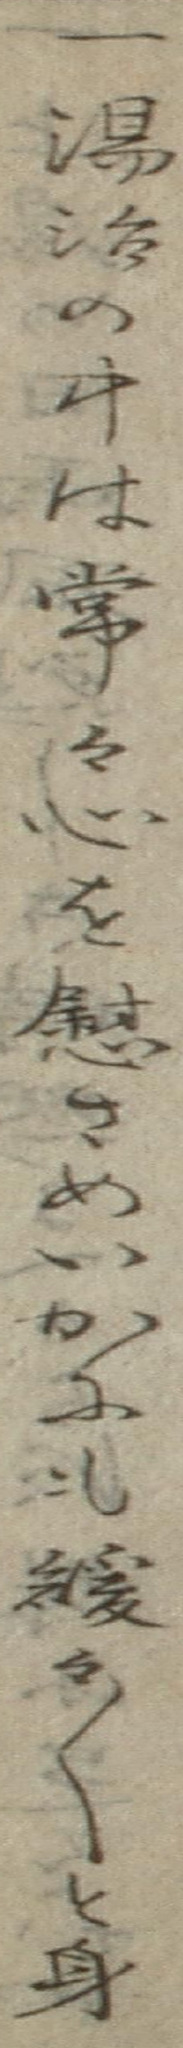一湯治に中は常々心を慰めいかにも緩々〳〵と身
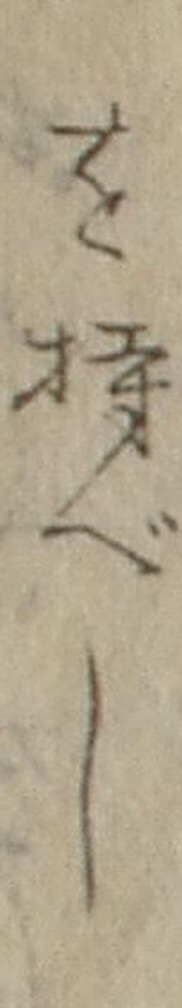を持べし
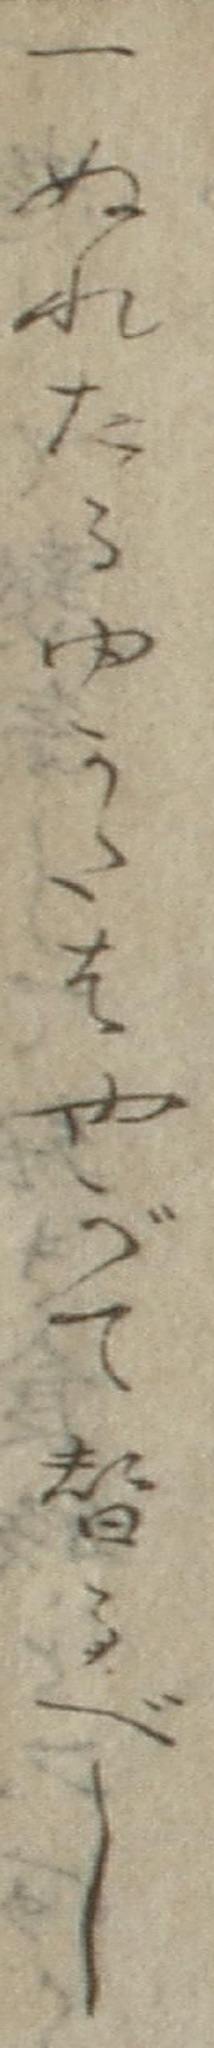一ぬれたるゆかたはやがて替るべし

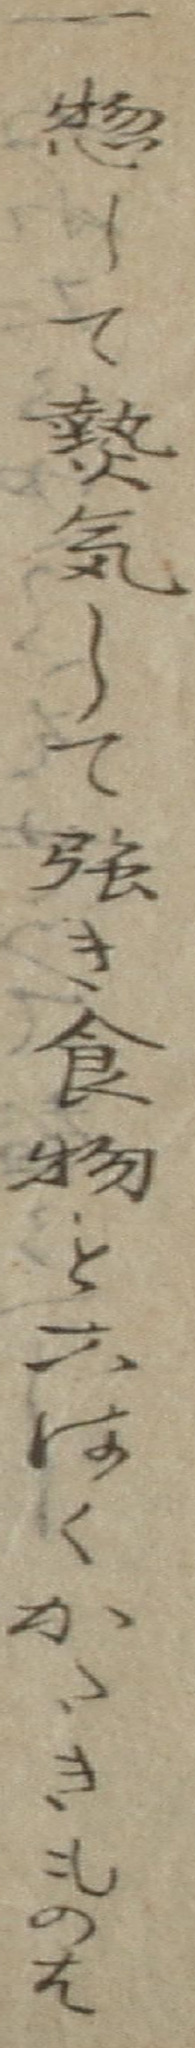一惣して熱気して強き食物とこはくかたきものは
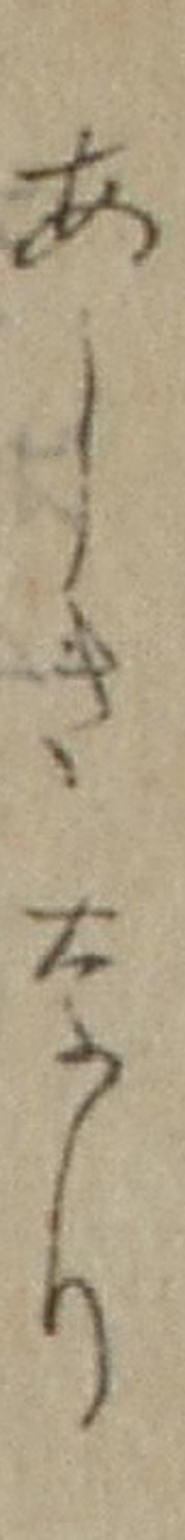あしきなり
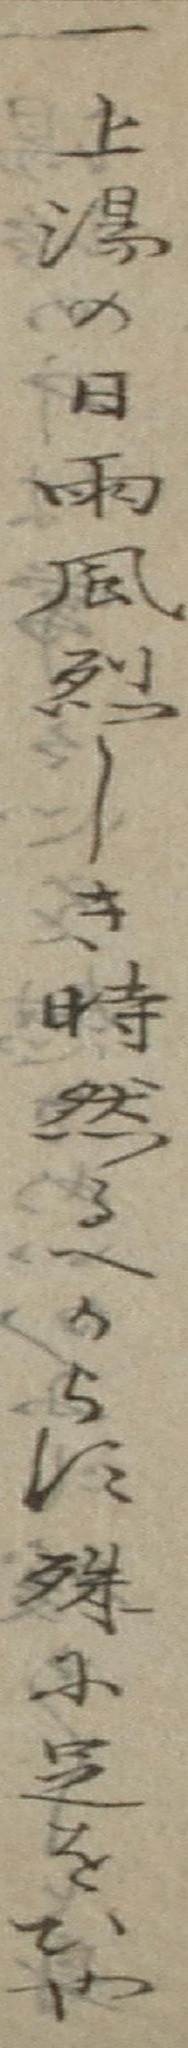一上湯の日雨風烈しき時然るへからす殊に足をひや
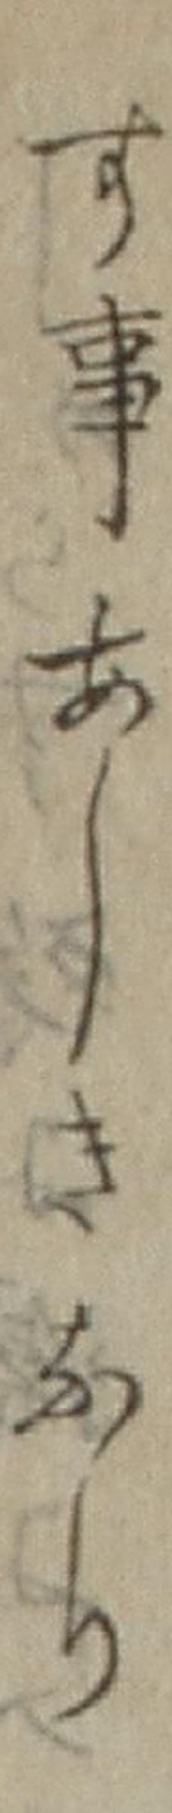す事あしきなり
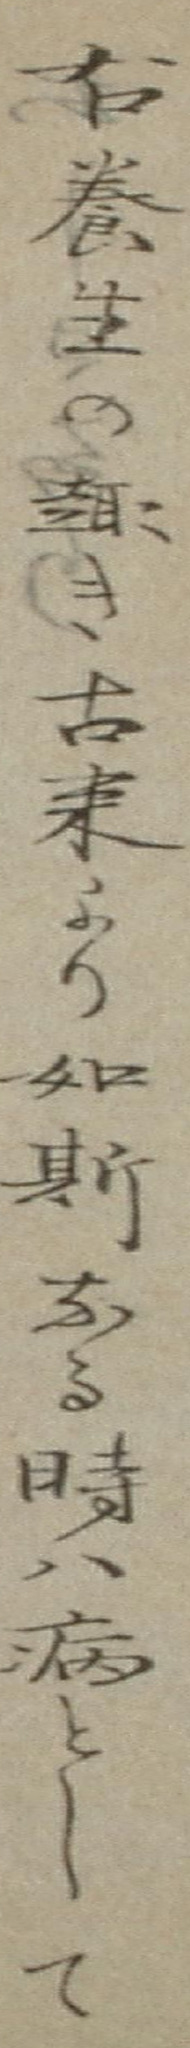右養生の趣き古来より如斯なる時は病として
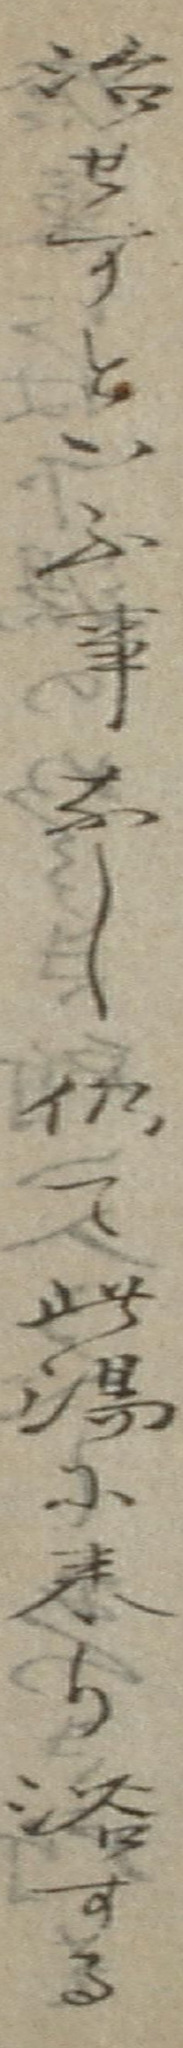治せすといふ事なし仍て此湯に来り浴する
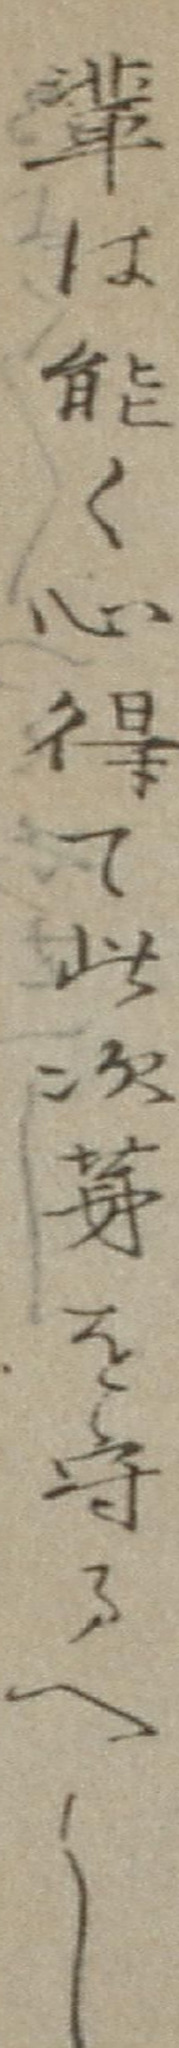輩は能く心得て此次第を守るへし
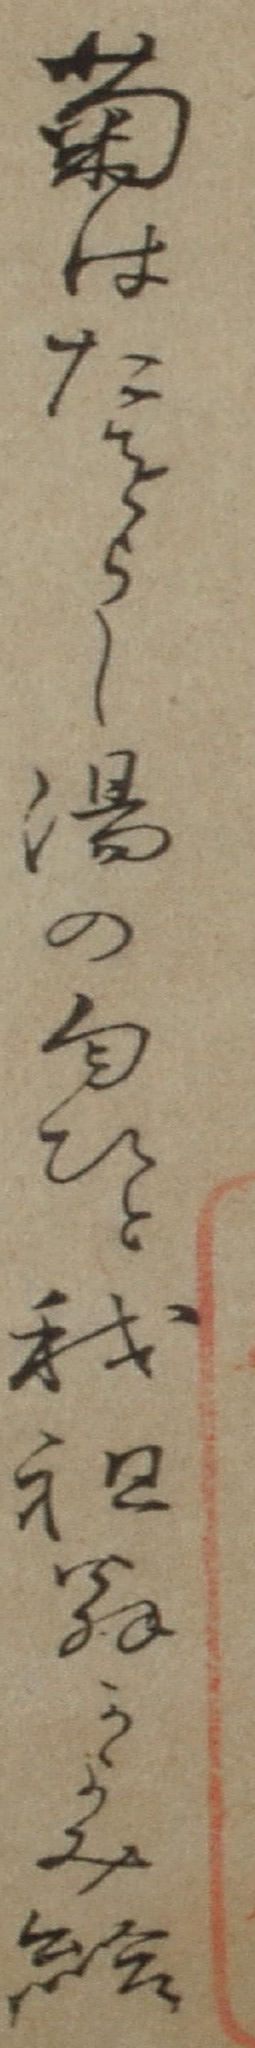菊はたをらし湯の匂ひと我祖翁かよみ給
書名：山中温泉縁記并ニ入浴之心得
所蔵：東京大学地震研究所図書室 Earthquake Research Institute Library, The University of Tokyo, JAPAN
